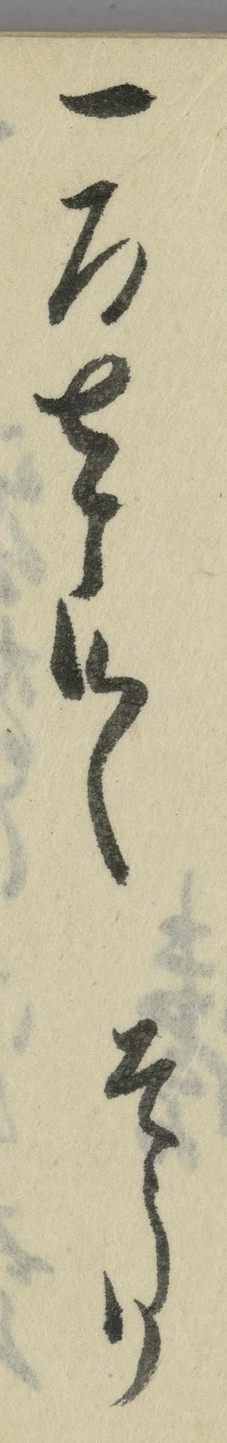一百七十弐文そうり
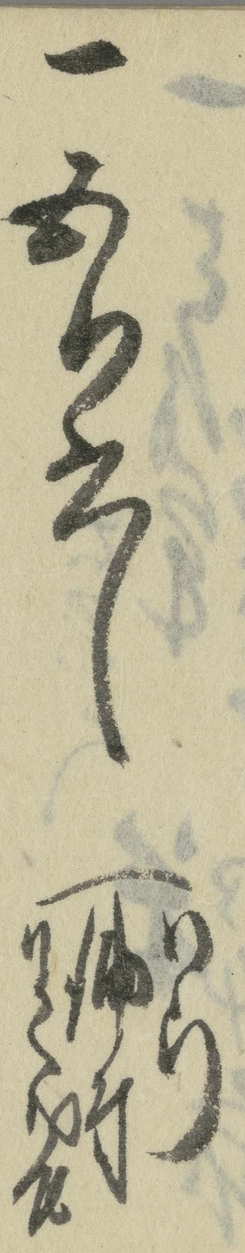一五百六文同断
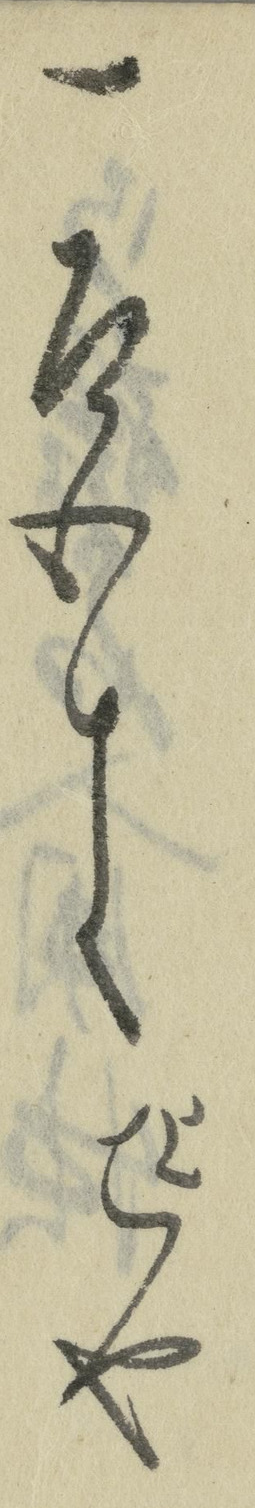一百五十文上ちや
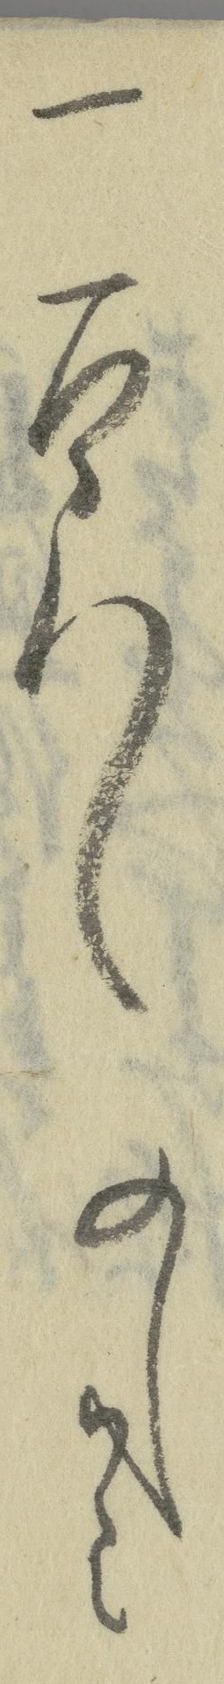一百八文のしかみ
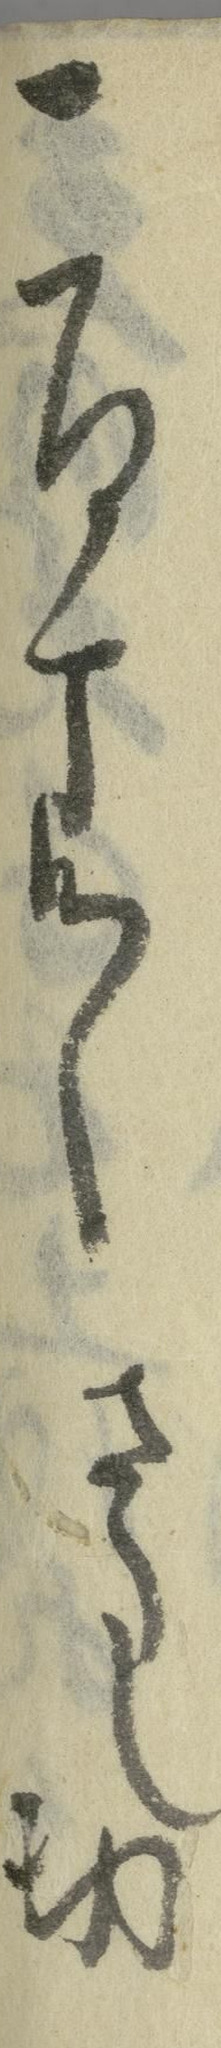一百十弐文さらし

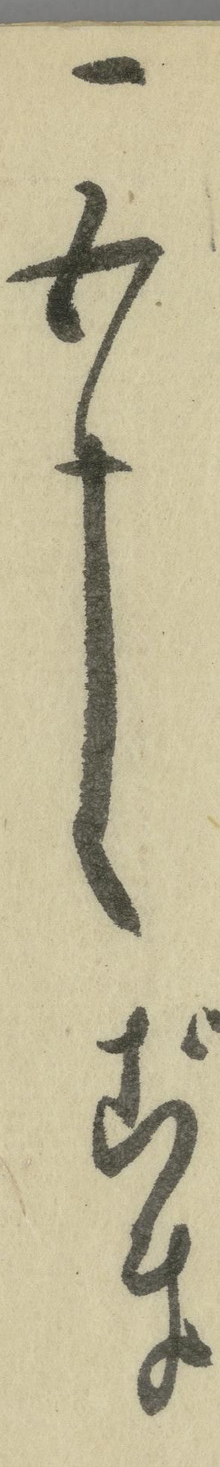一五十文ごま
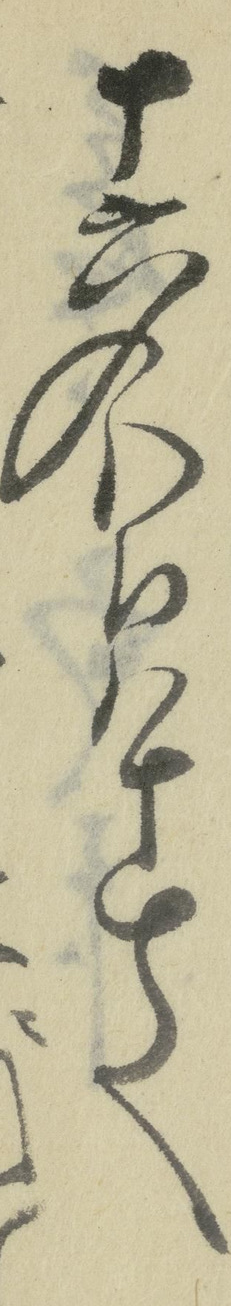十六貫八百八十七文
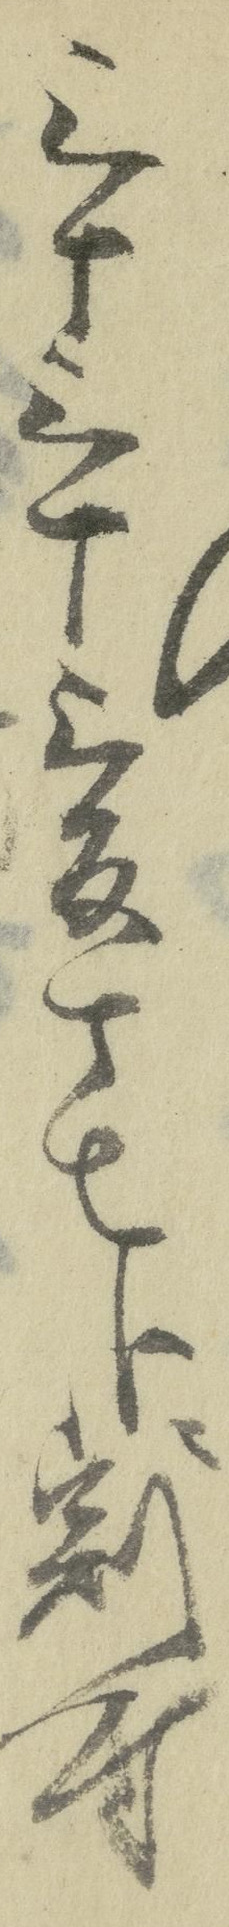三十三丁三反十七分二割付
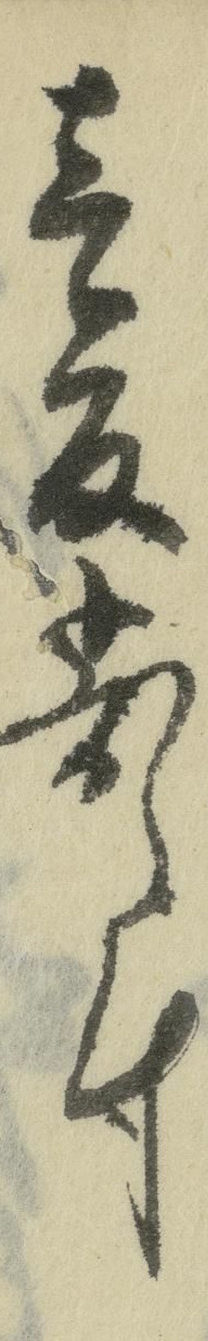壱反歩二付
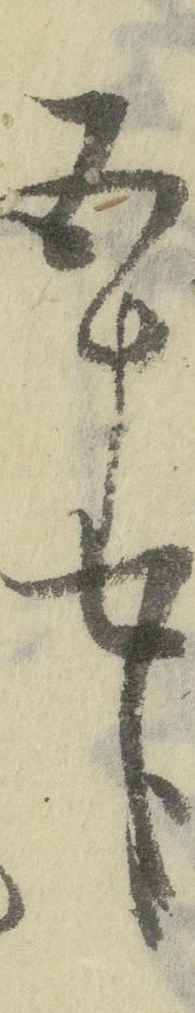五十セ分

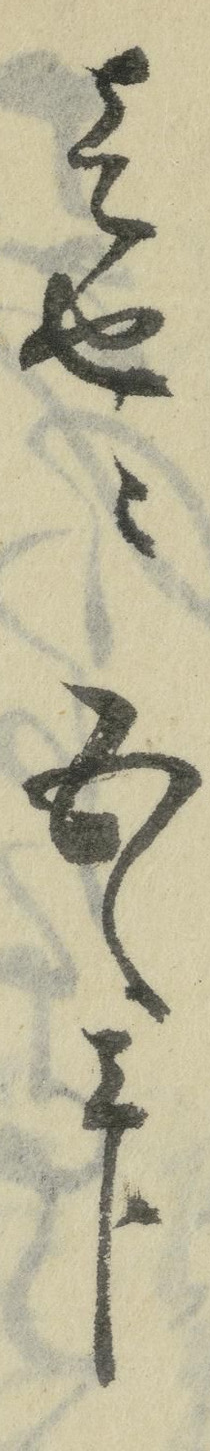壱せ二五文壱分
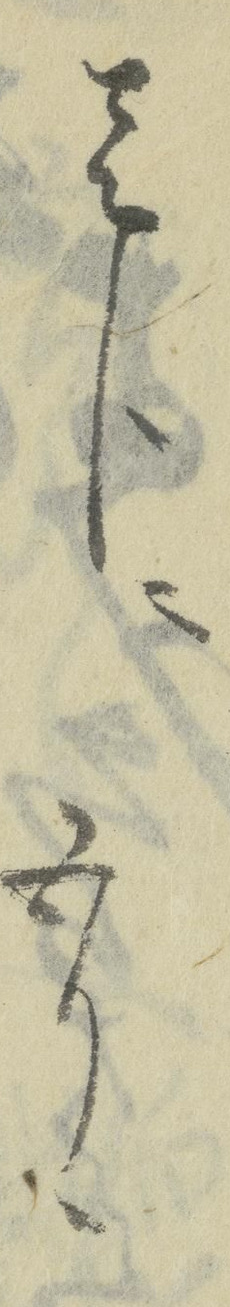壱分二五り

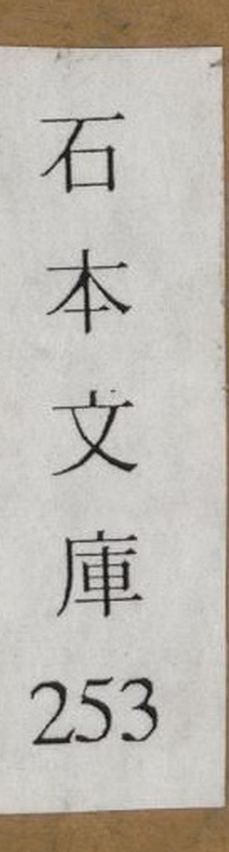石本文庫
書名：天明淺間噴火ニ関スル書類
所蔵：東京大学地震研究所図書室 Earthquake Research Institute Library, The University of Tokyo, JAPAN
